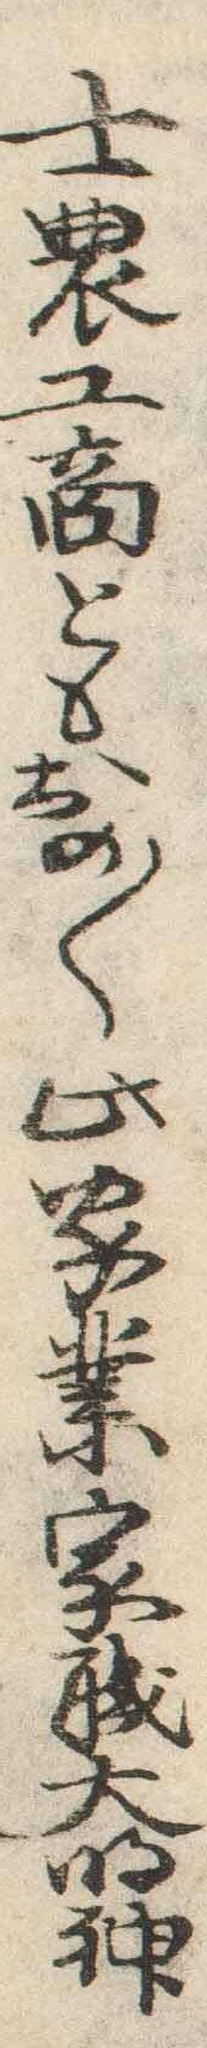士農工商ともおの〳〵此家業家職大明神
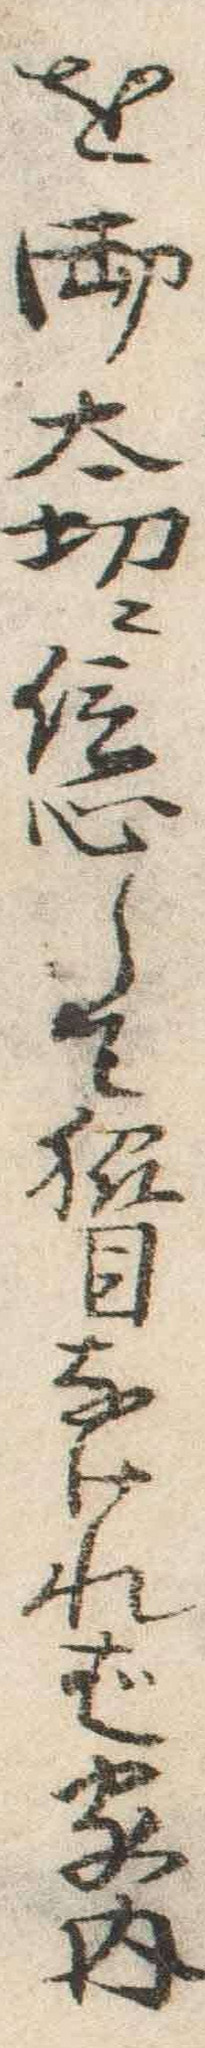を御太切に信心して脇目なければ家内
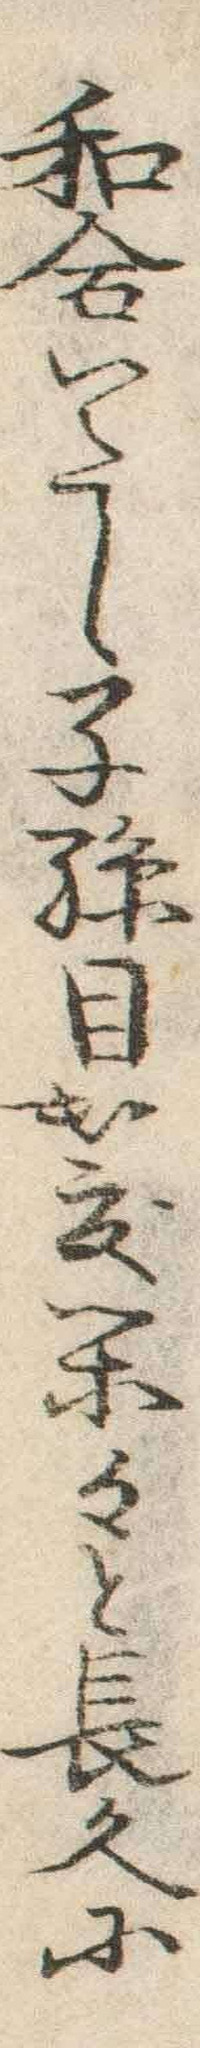和合いたし子孫目出度栄々と長久に
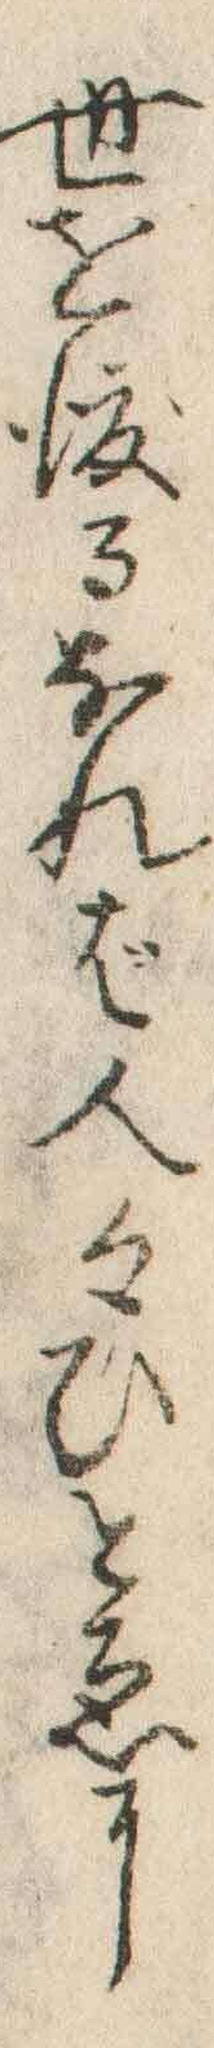世を渡るなれば人々ひとゑに
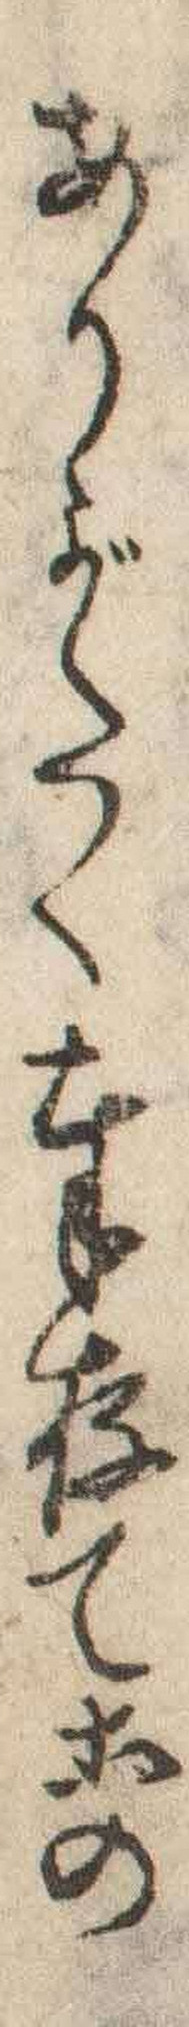ありがたく奉存てこの
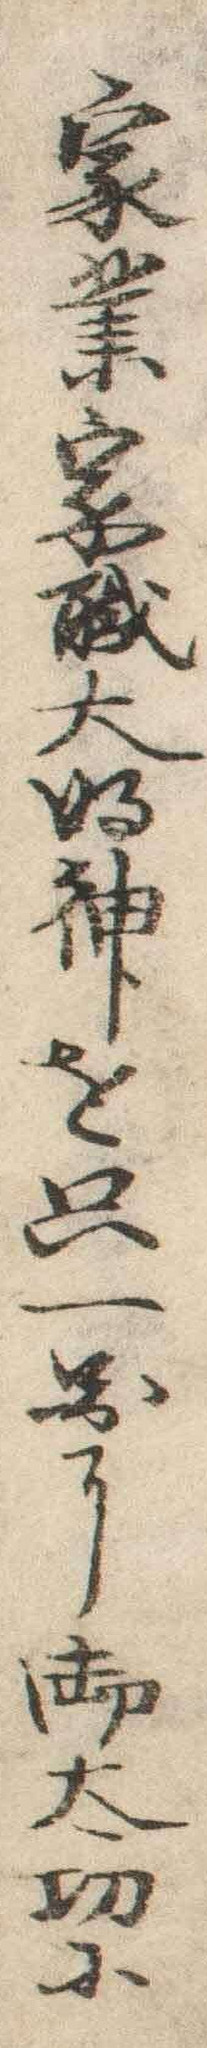家業家職大明神を只一図に御太切に

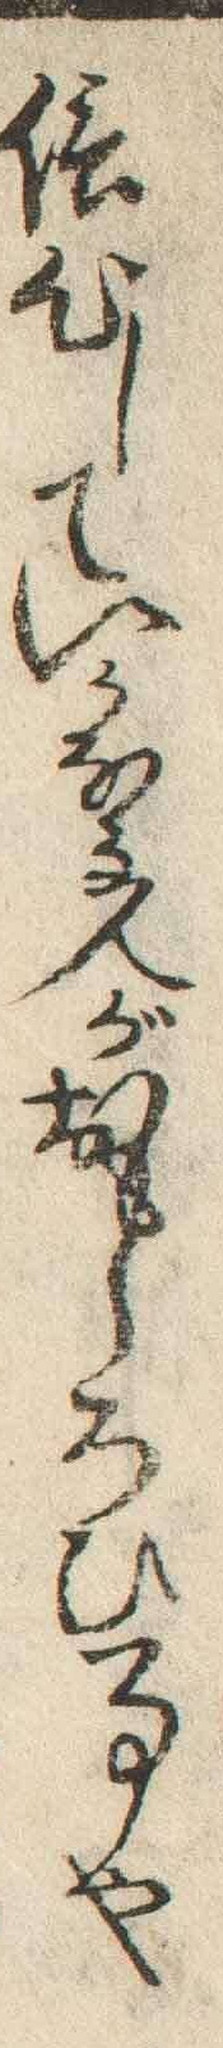信心していかなる人がおもしろひ事や
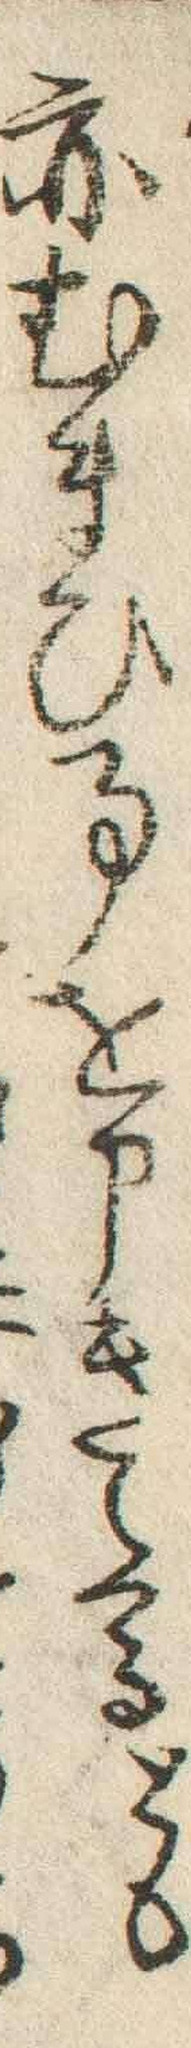亦むまひ事を申きたるとも
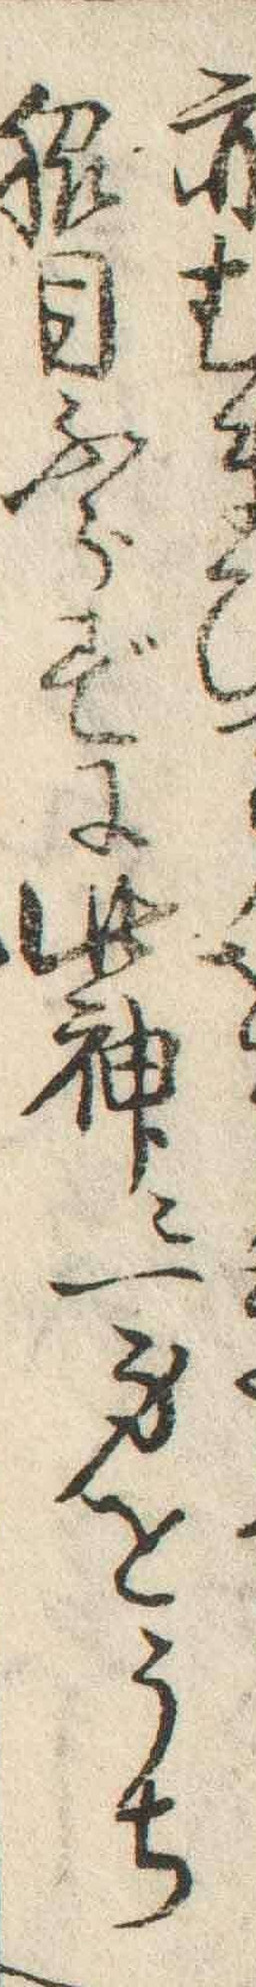脇目ふらずに此神に一身をうち
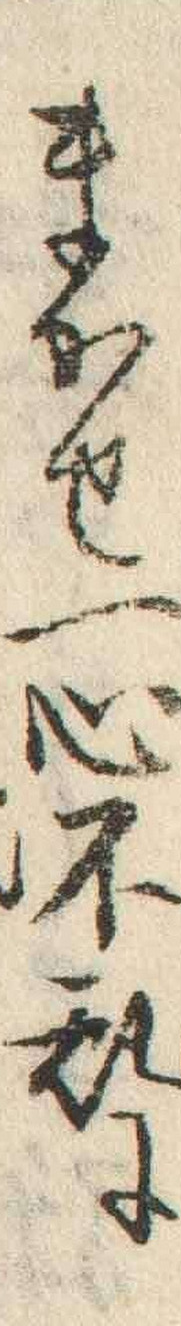まかせ一心不乱に
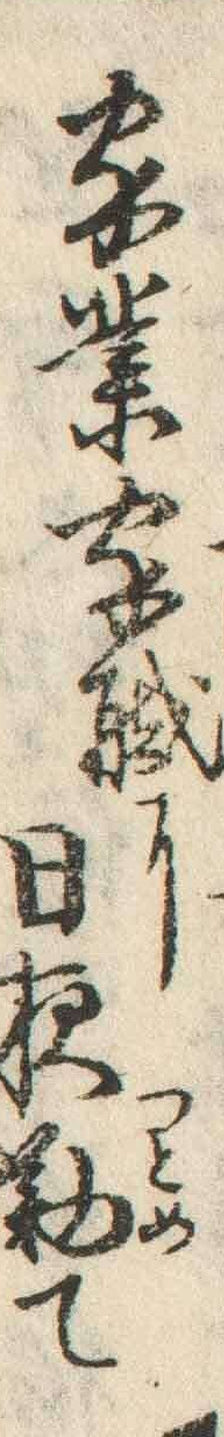家業家職に
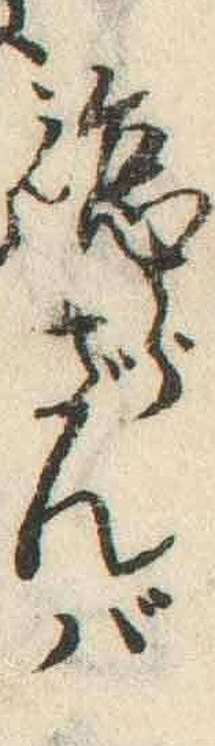怠らざんば
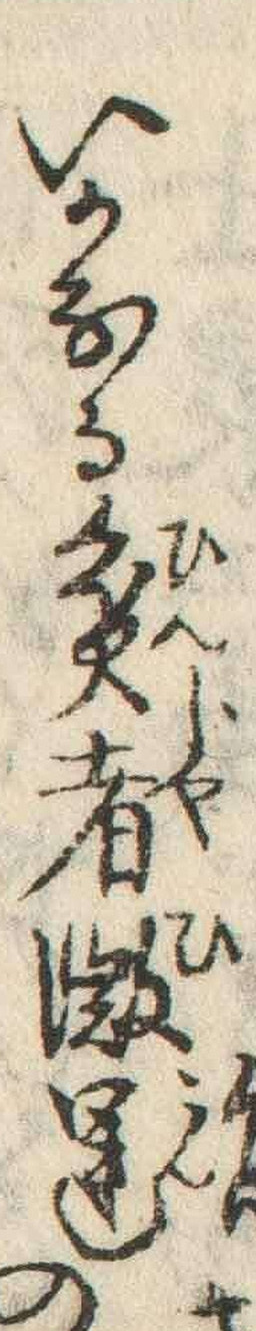いかなる貧者微運の者も
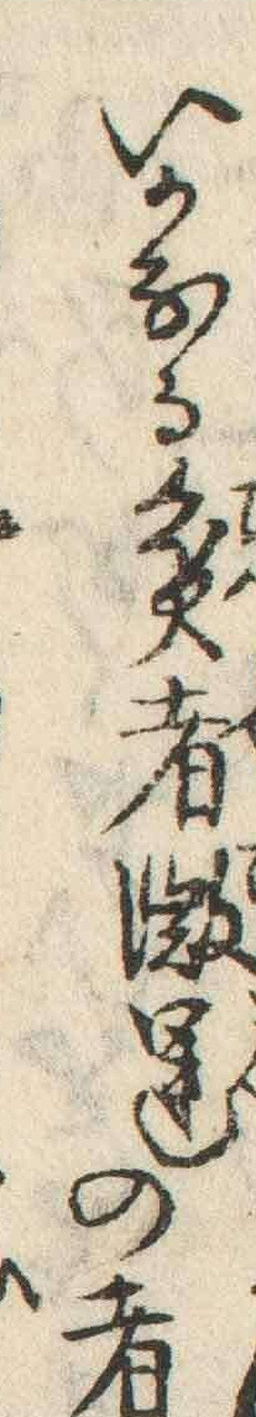いかなる貧者微運の者も
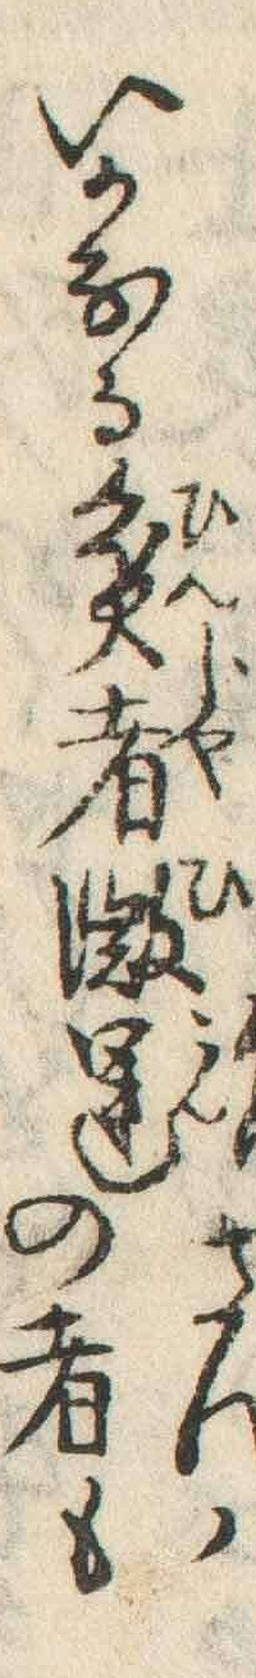いかなる貧者微運の者も
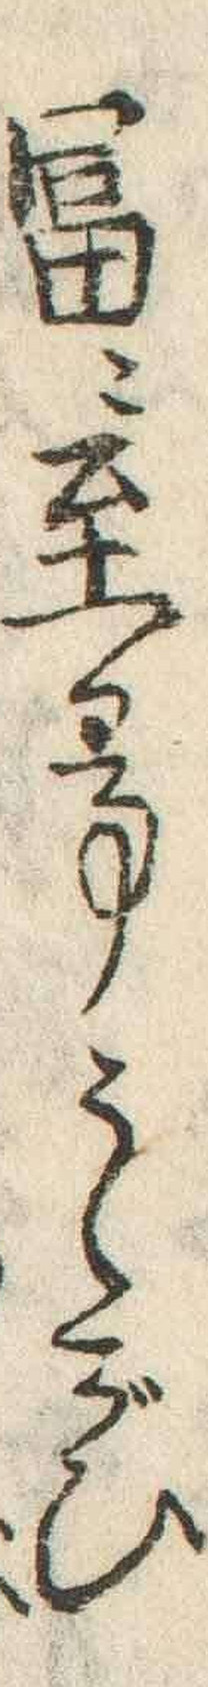冨に至る事うたがひ
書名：撫育草
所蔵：東京学芸大学附属図書館 国文学研究資料館
